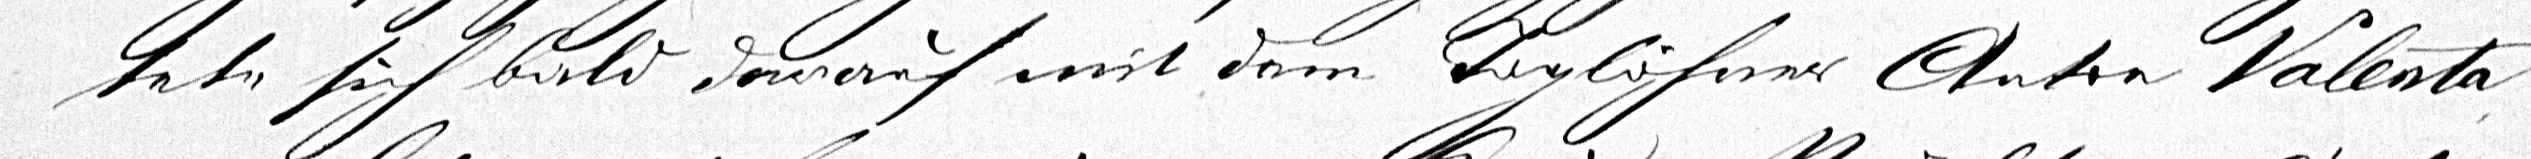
tete sich bald darauf mit dem Taglöhner Anton Valenta
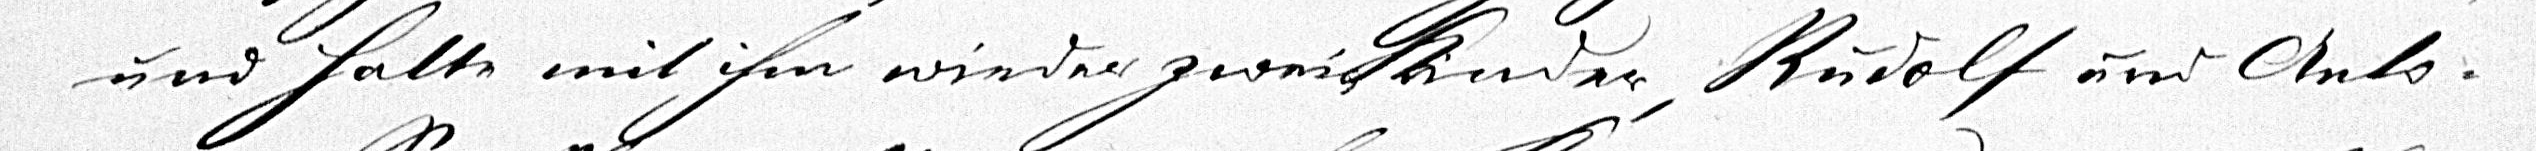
und Halte mit ihm wieder zweistrader, Rudolf und Anto¬
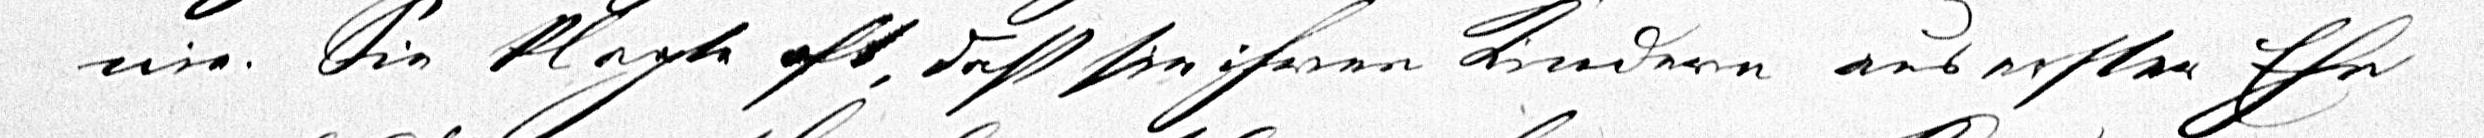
nie. Sie Plagte oft, daß sie ihrer Kindere aus erster Ehr
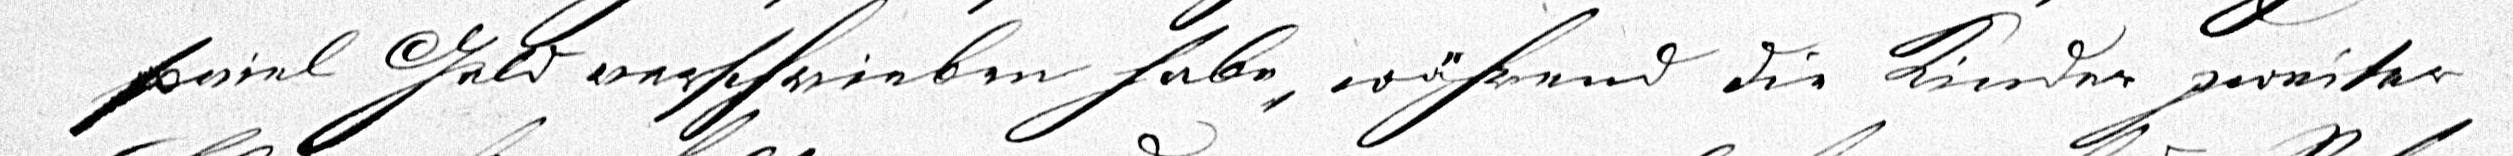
soviel Geld verschrieben habe, während die Kinder zweiter
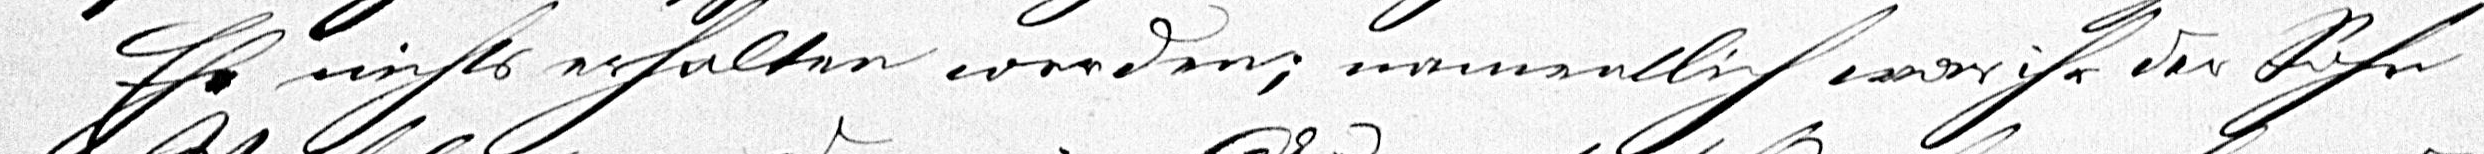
Ehr nichts erhalten werden, namentlich war ihr der Sohn
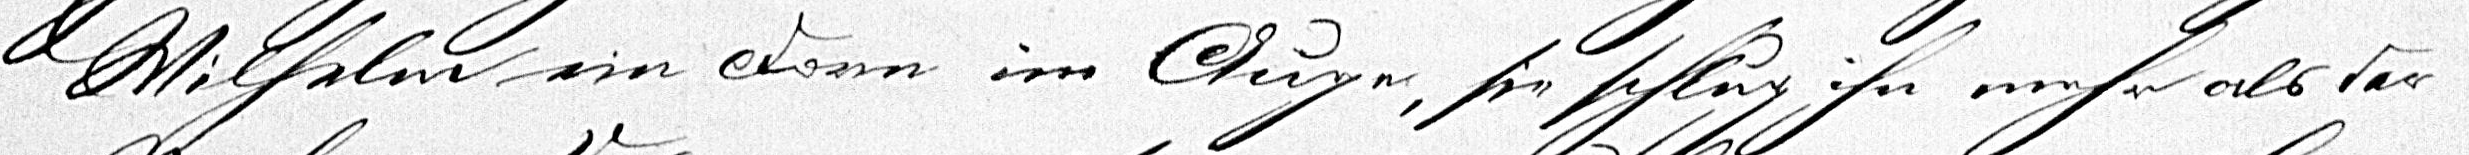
Wilhelm ein Forn im Auge, sie schlug ihn mehr als der
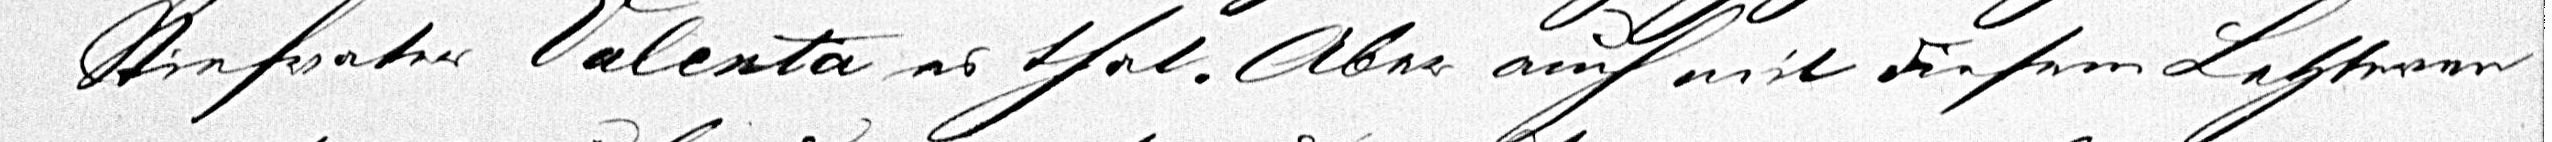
Stiefvater Valenta es Thal. Aber auch mit diesem Letzterer
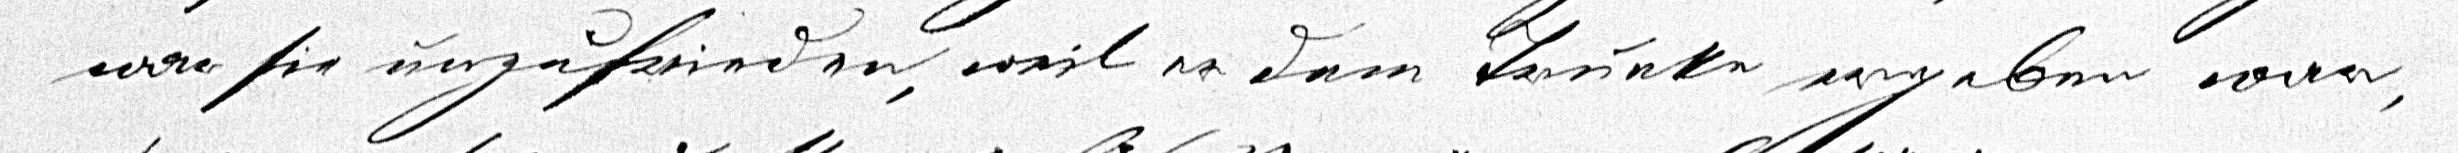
war sie unzufrieden, weil er dem Trueke ergeben war,
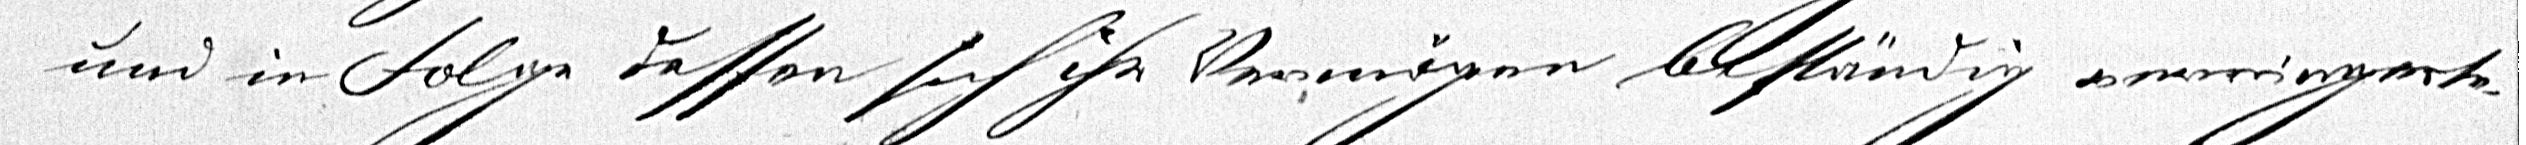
und in Folge dessen sich ihr Vermögen beständig verringerte.
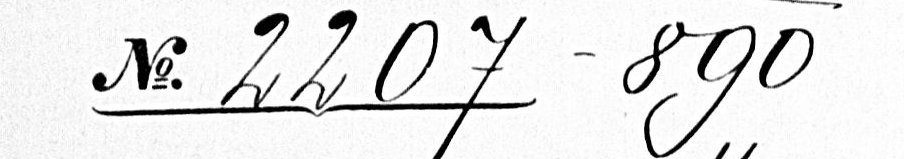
N° 2207 - 890
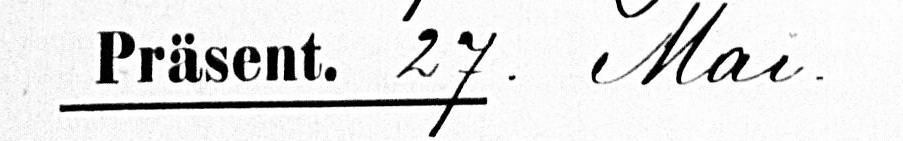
Präsent. 27. Mai.
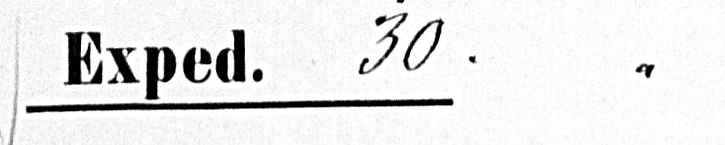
Exped. 30. Mai
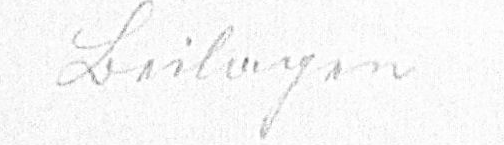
Beilagen
